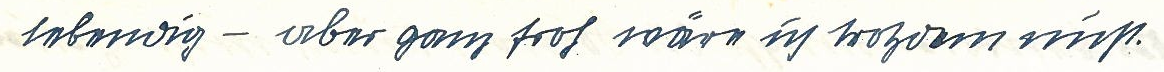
lebendig – aber ganz froh wäre ich trotzdem nicht.
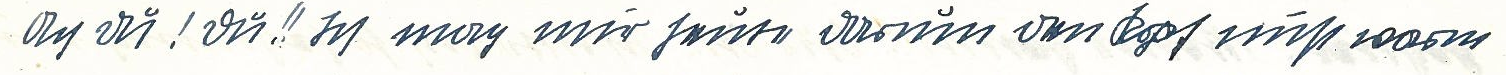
Ach Du! Du!! Ich mag mir heute darum den Kopf nicht warm
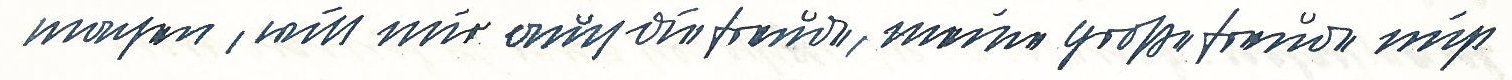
machen, will mir auch die Freude, meine große Freude nicht
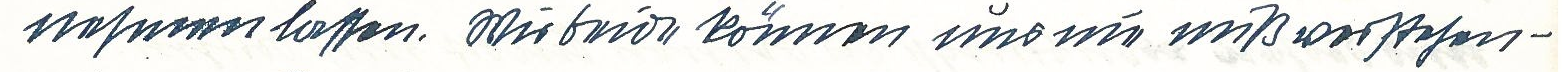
nehmen lassen. Wir beide können uns nie mißverstehen –
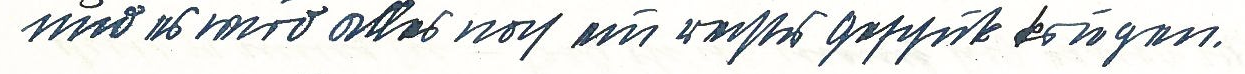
und es wird alles noch ein rechtes Geschick kriegen.
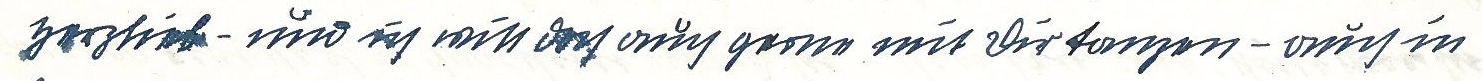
Herzlieb – und ich will doch auch gerne mit Dir tanzen – auch in
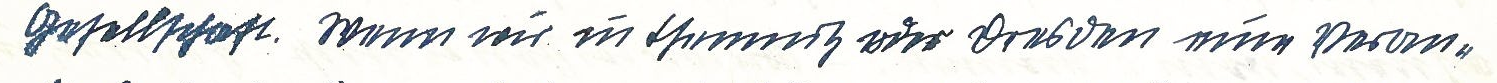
Gesellschaft. Wenn wir in Chemnitz oder Dresden eine Veran¬
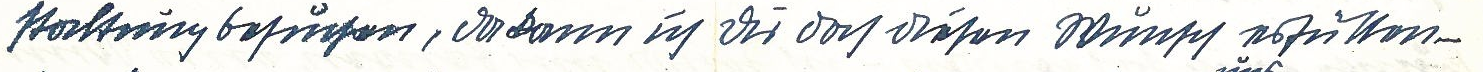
staltung besuchen, da kann ich Dir doch diesen Wunsch erfüllen –
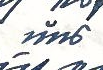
uns
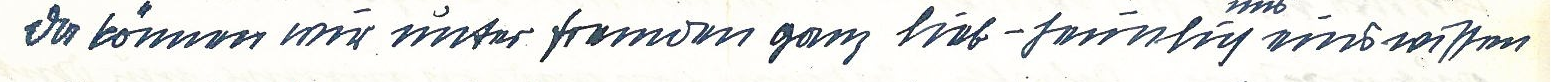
da können wir unter Fremden ganz lieb heimlich eins wissen
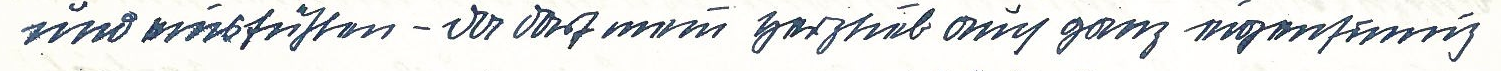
und eins fühlen – da darf mein Herzlieb auch ganz eigensinnig
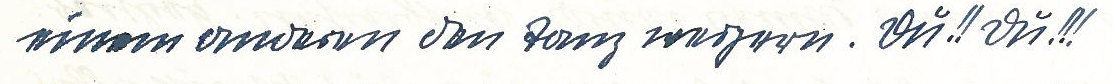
einem anderen den Tanz weigern. Du!! Du!!
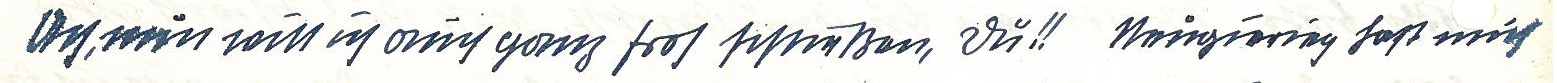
Ach, nun will ich auch ganz froh schließen, Du!! Neugierig hast mich
